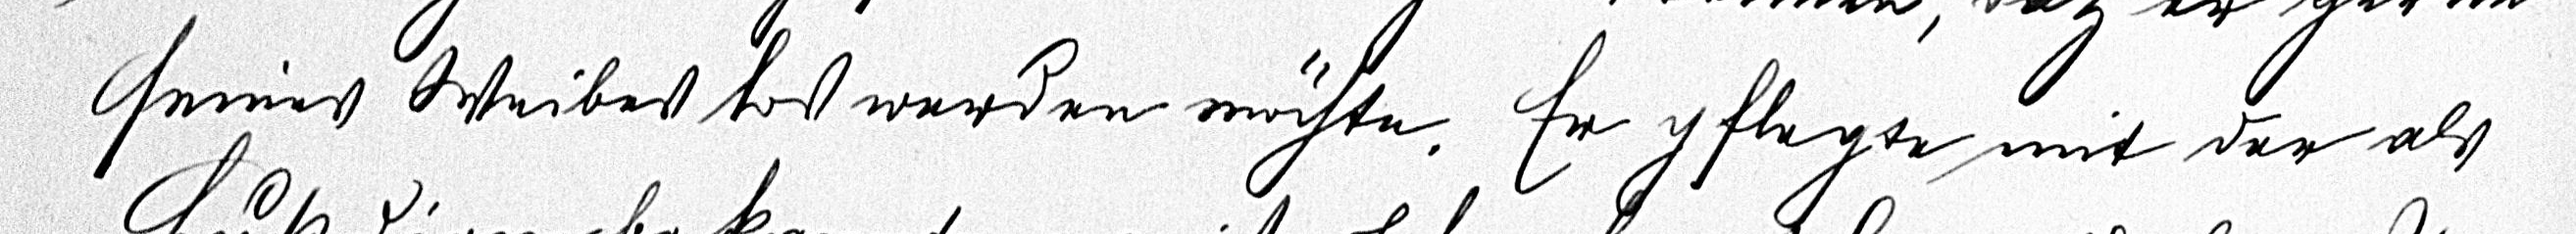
seines Weibes los werden möchte. Er pflegte mit der als
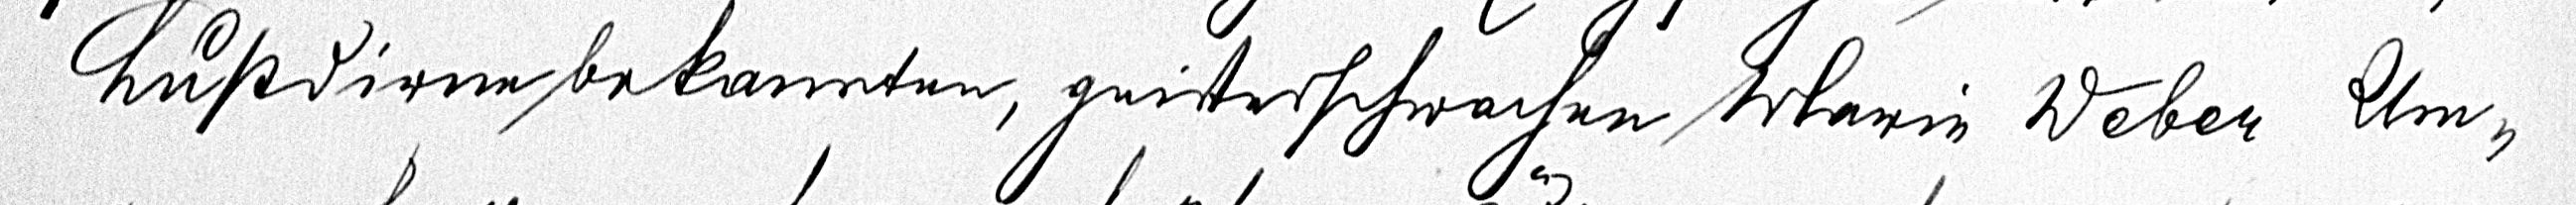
Lustdirne bekannten, geistesschwachen Marie Weber Um¬
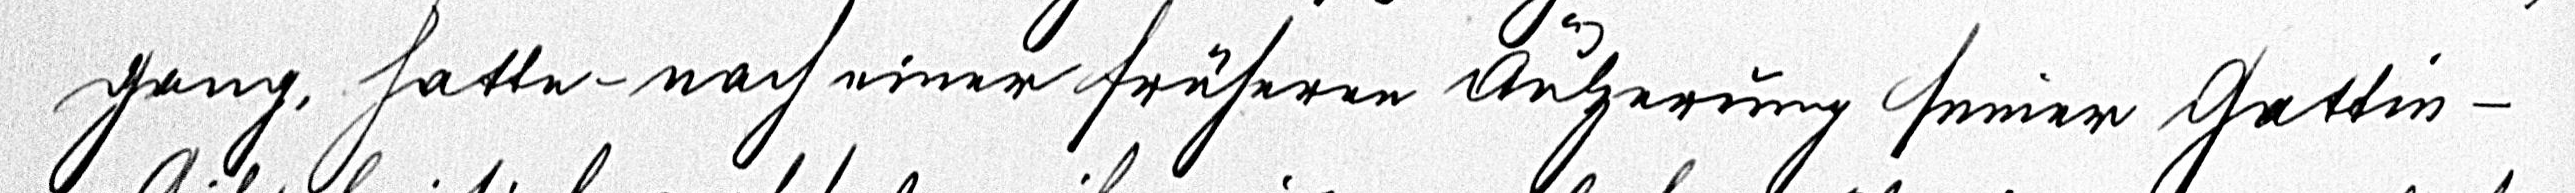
gang, hatte-nach einer früheren Äußerung seiner Gattin-
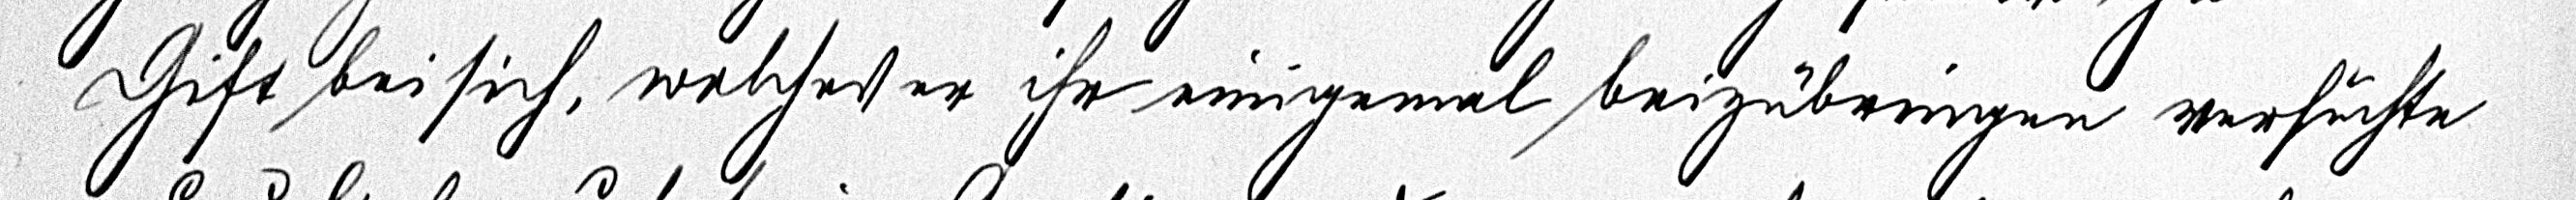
Gift bei sich, welches er ihr einigemal beizubringen versuchte
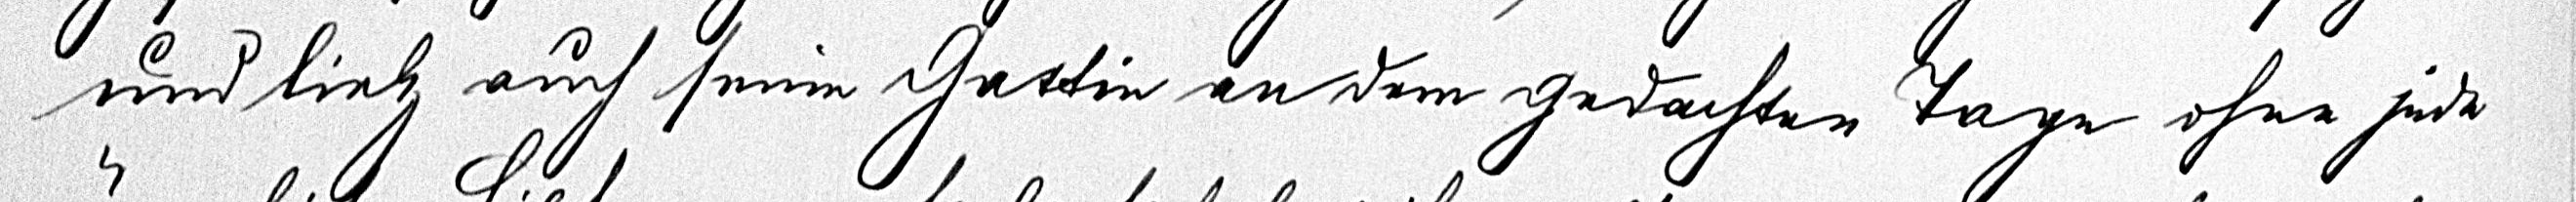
und ließ auch seine Gattin an dem gedachten Tage ohne jede
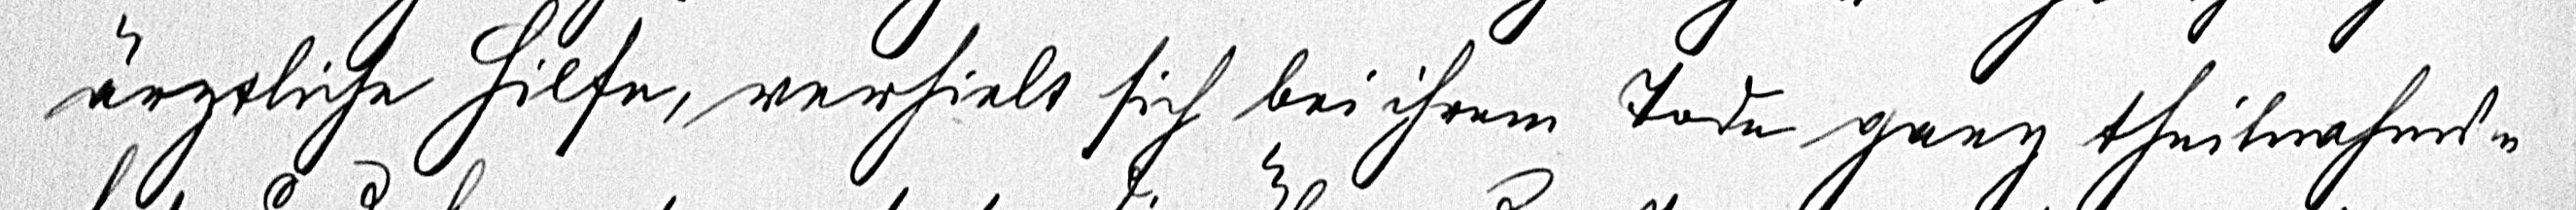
ärztliche Hilfe, verhielt sich bei ihrem Tode ganz theilnahms¬
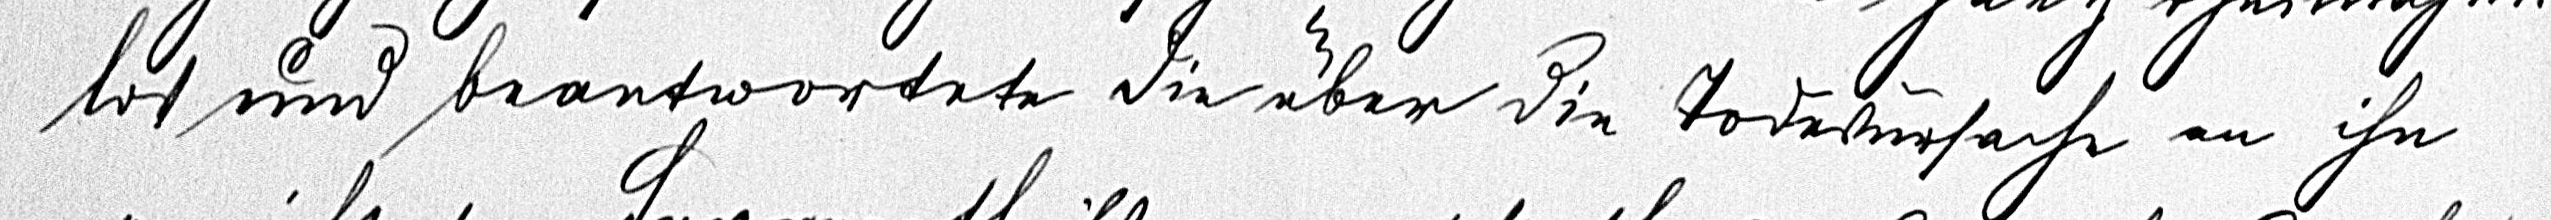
los und beantwortete die über die Todesursache an ihn
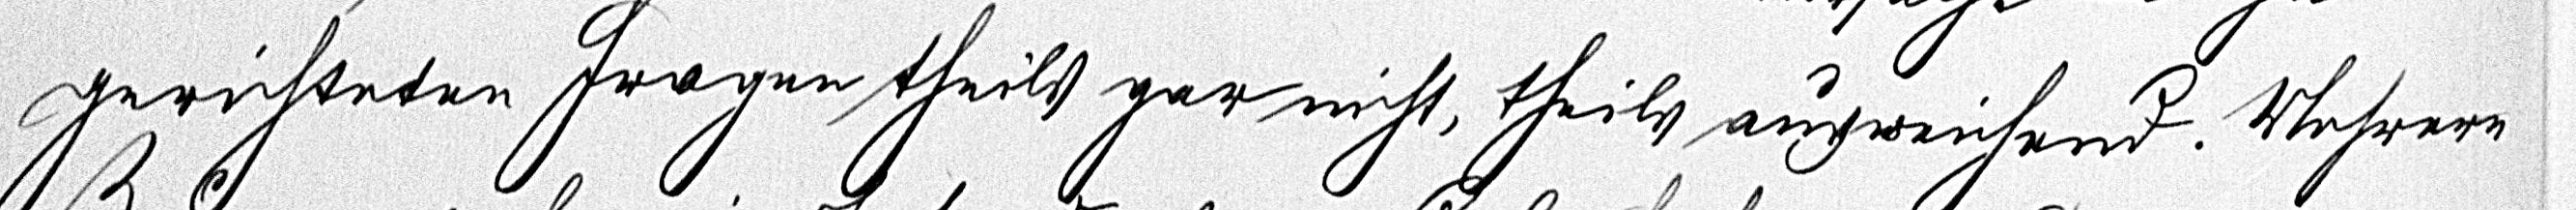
gerichteten Fragen theils gar nicht, theils ausweichend. Mehrere
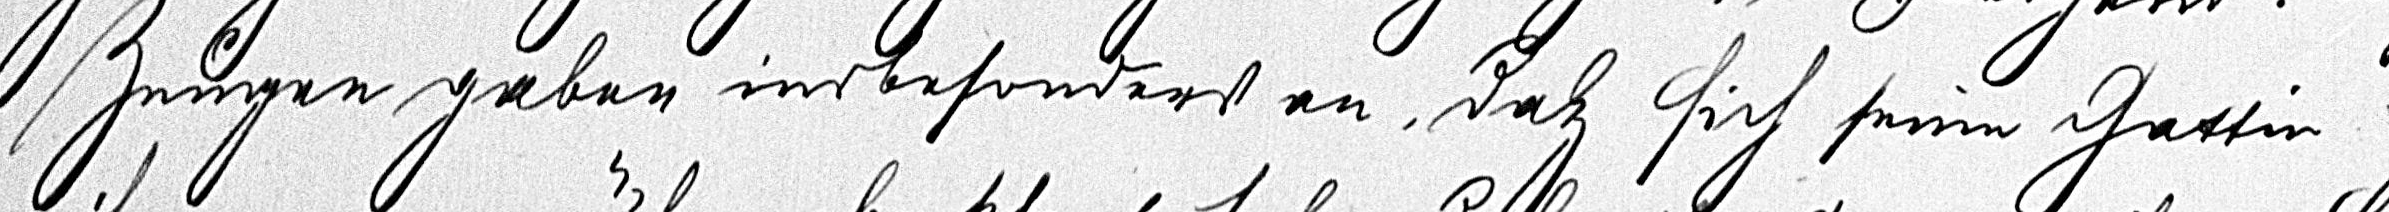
Zungen gaben insbesonders an, daß sich seine Gattin
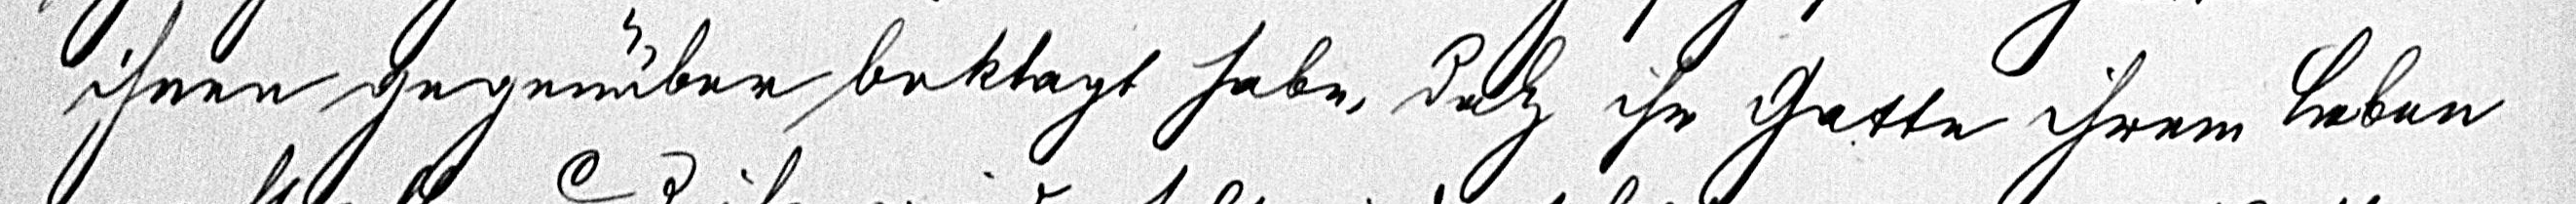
ihnen gegenüber beklagt habe, daß ihn Gatte ihrem laben
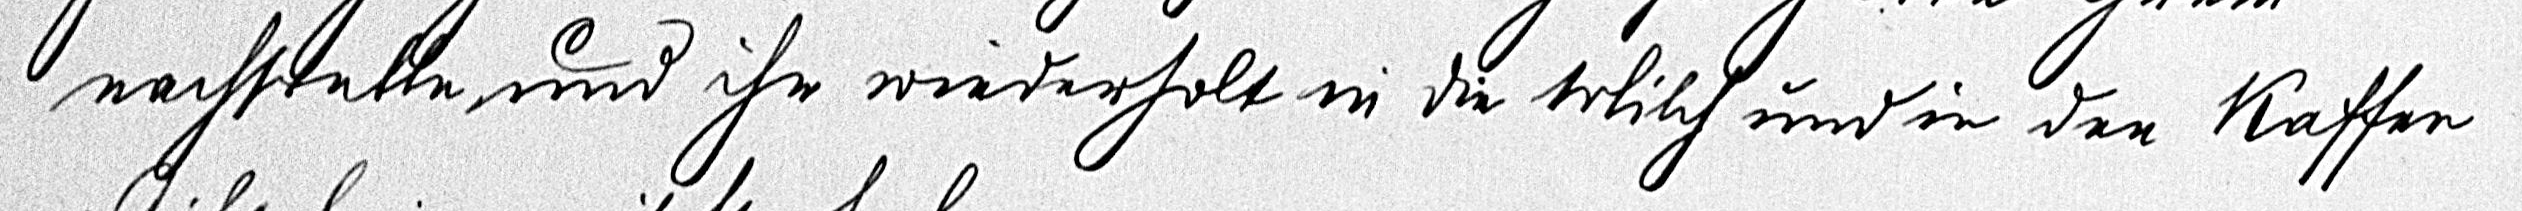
nachstelle und ihr wiederholt in die Milch und in den Kaffen
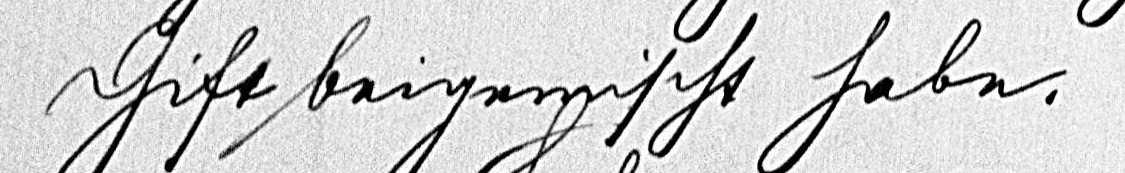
Gift beigemischt habe.
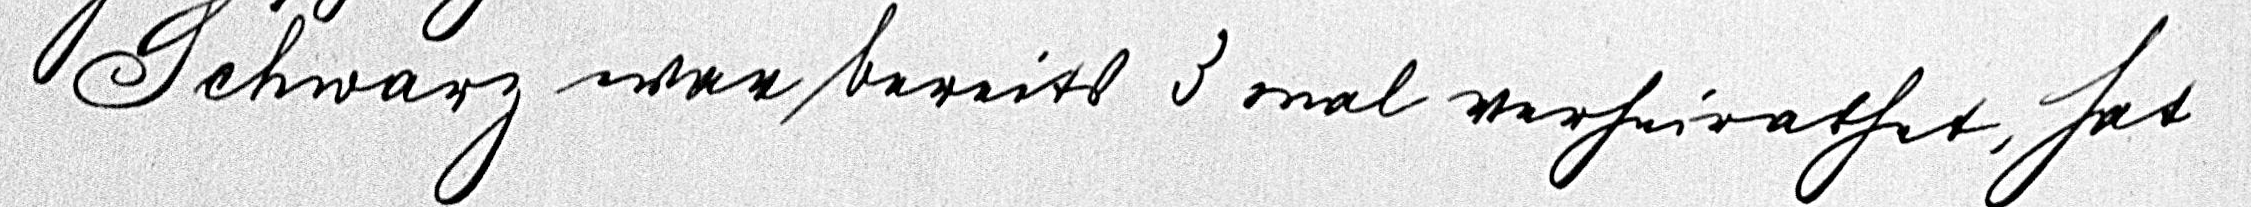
Schwarz war bereits 3 mal verheirathet, hat
